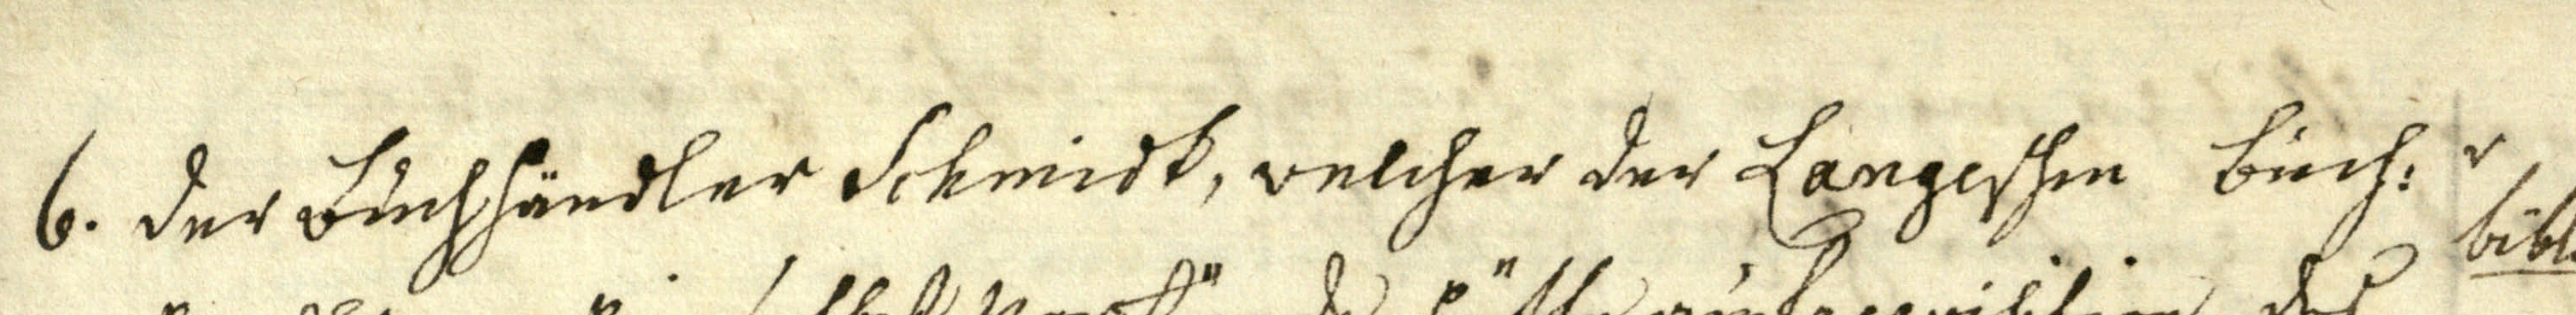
6. der Buchändler Schmidt, welcher der Langeschen Buch¬
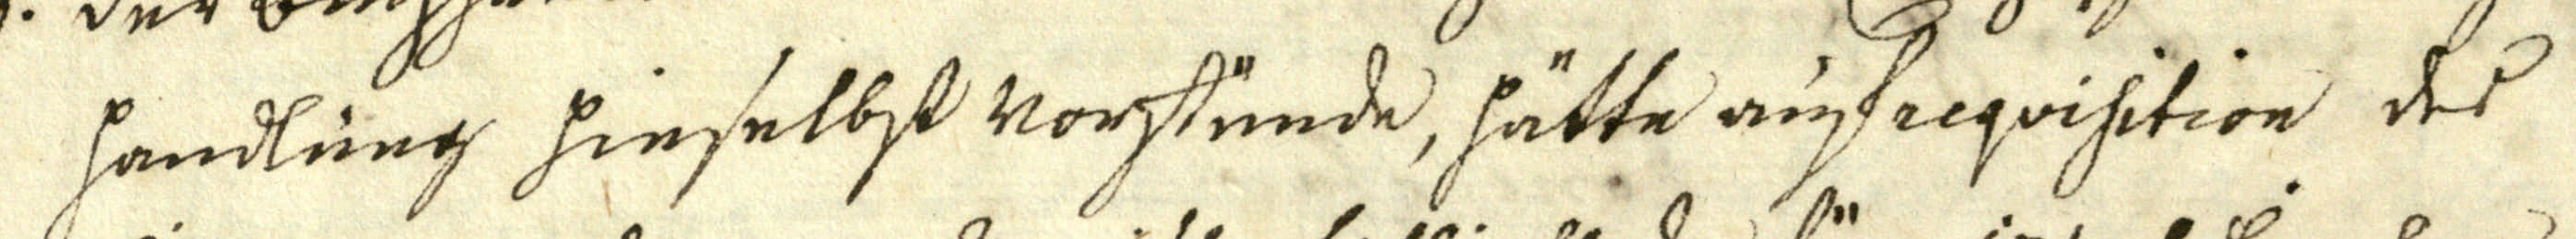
handlung hieselbst vorstünde, hätte auf requisition des
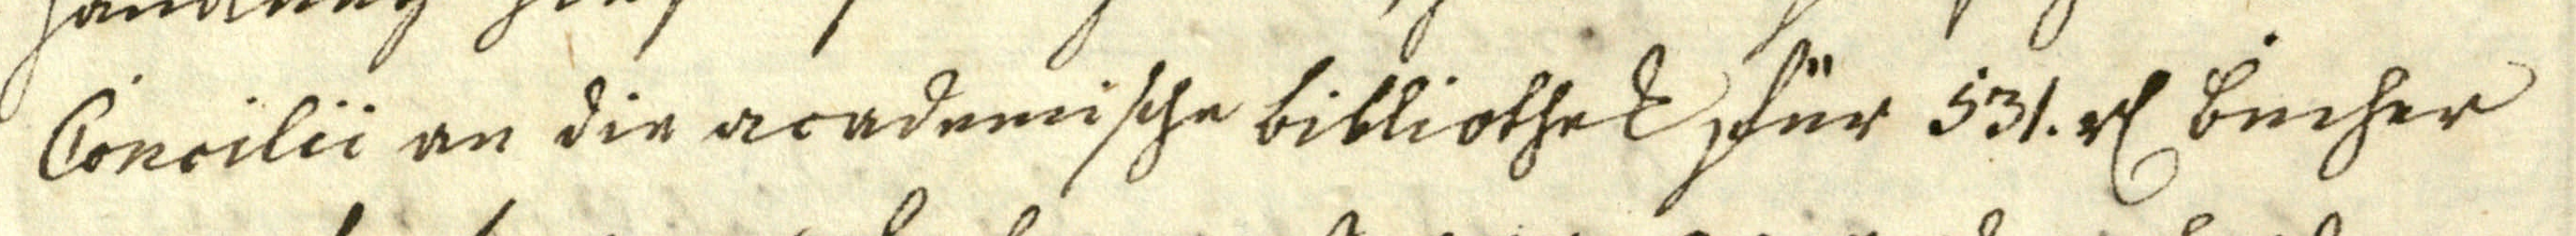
Concilii an die academische Bibliothek für 531. rt. Bücher
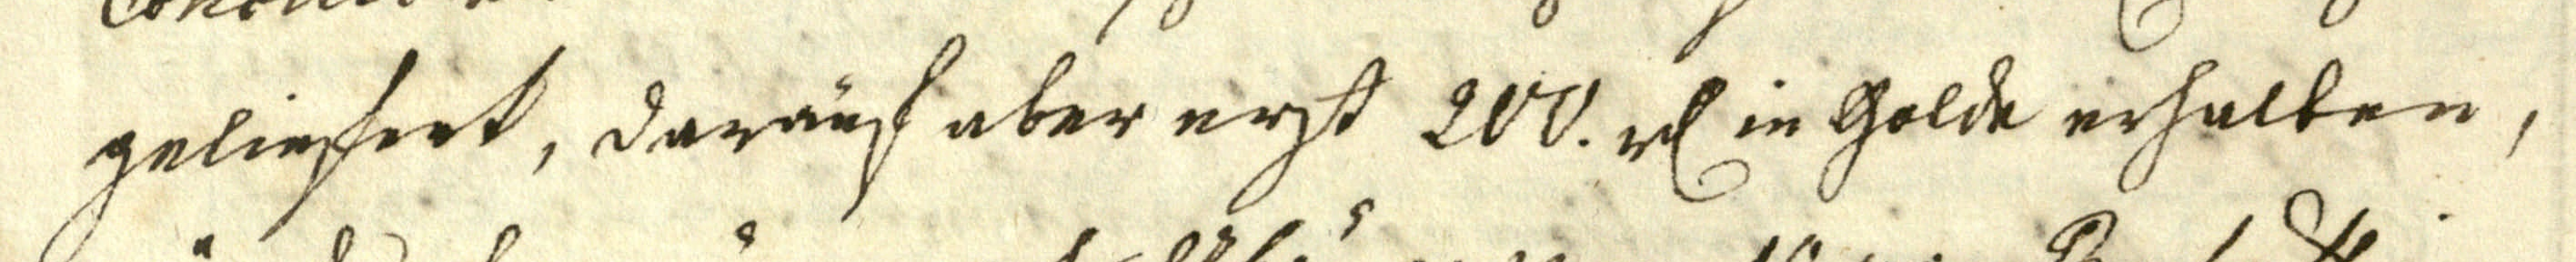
geliefert, darauf aber erst 200. rt in Golde erhalten,
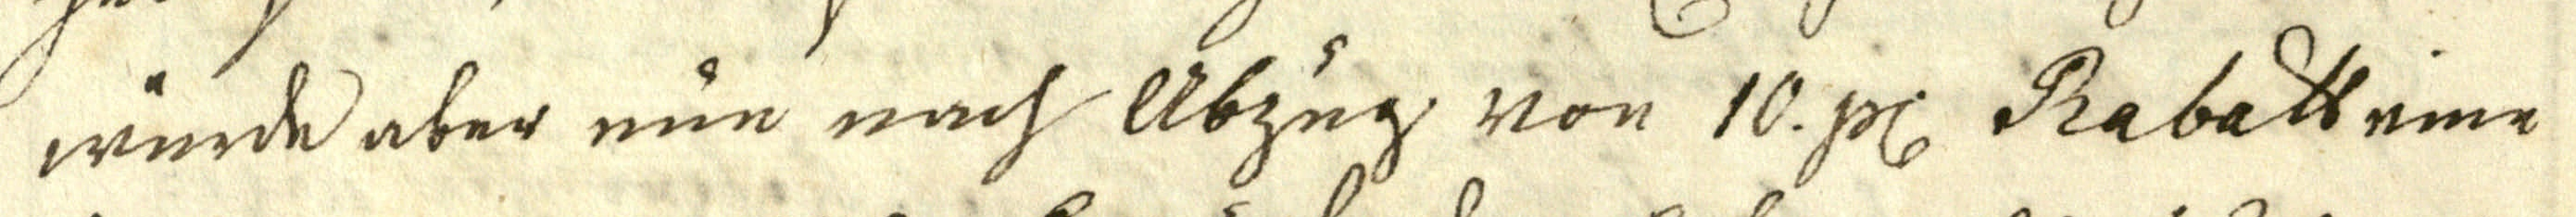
würde aber nun nach Abzug von 10 pr. Rabatt eine
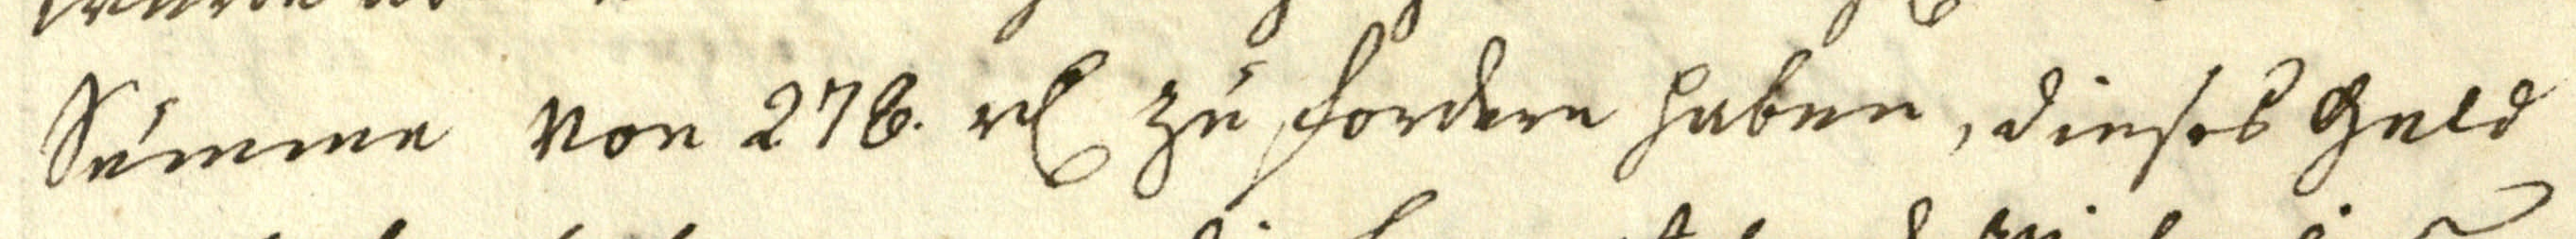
Summe von 278. rt. zu fordern haben, dieses Geld
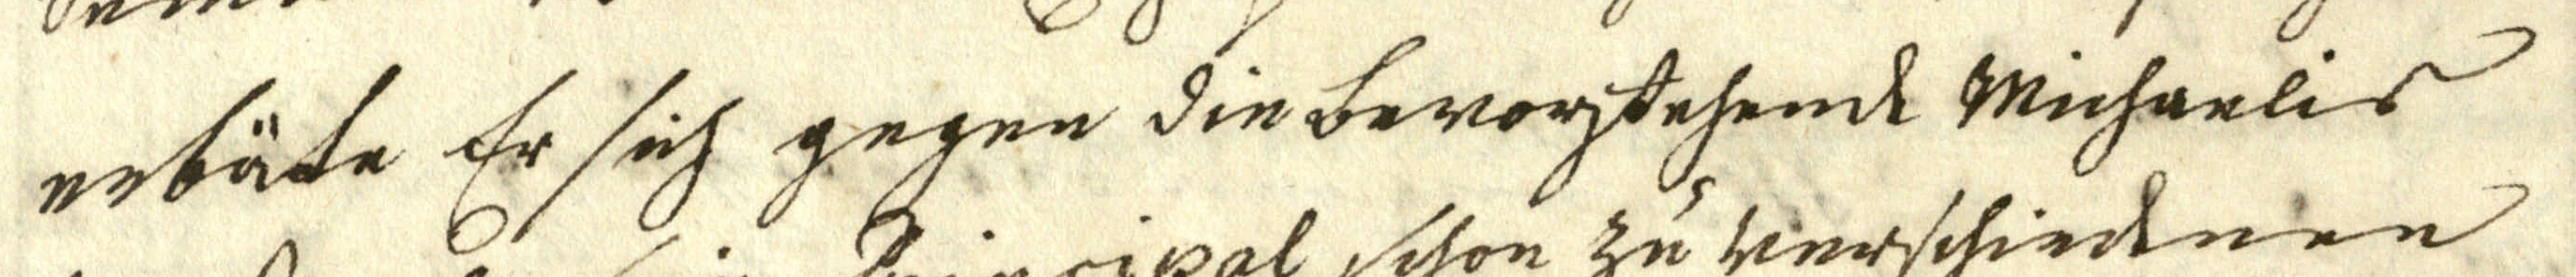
erbäte Er sich gegen die bevorstehende Michaelis
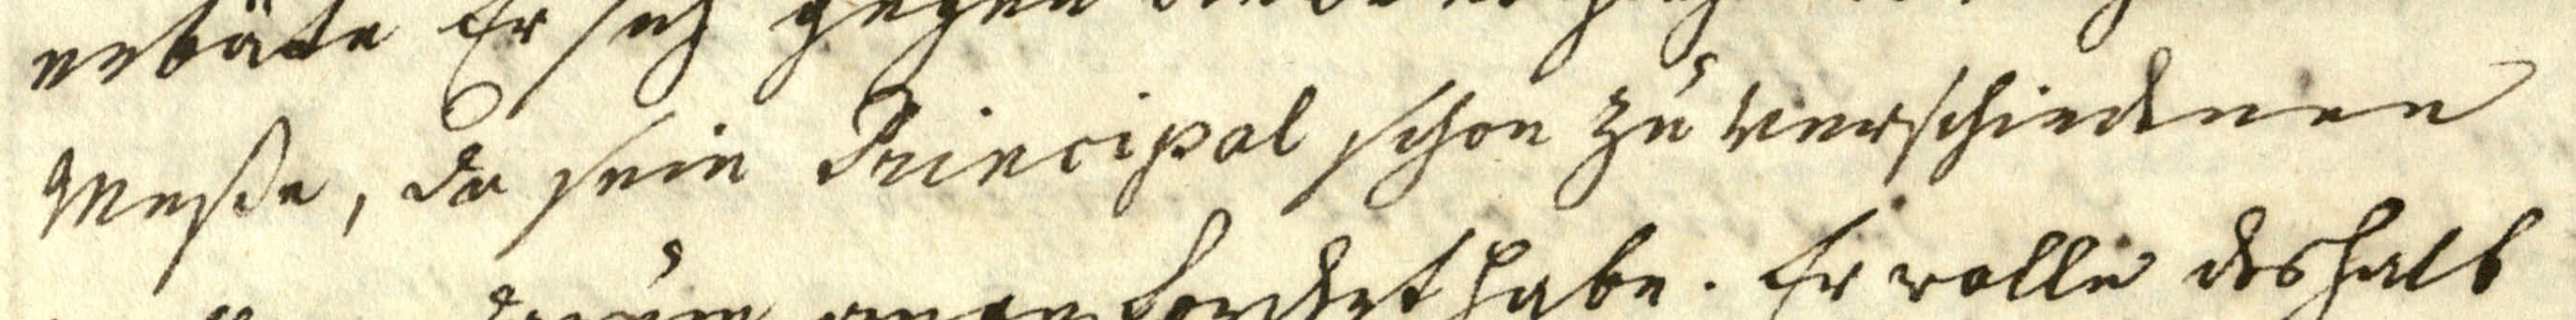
Meße, da sein Principal schon zu verschiedenen
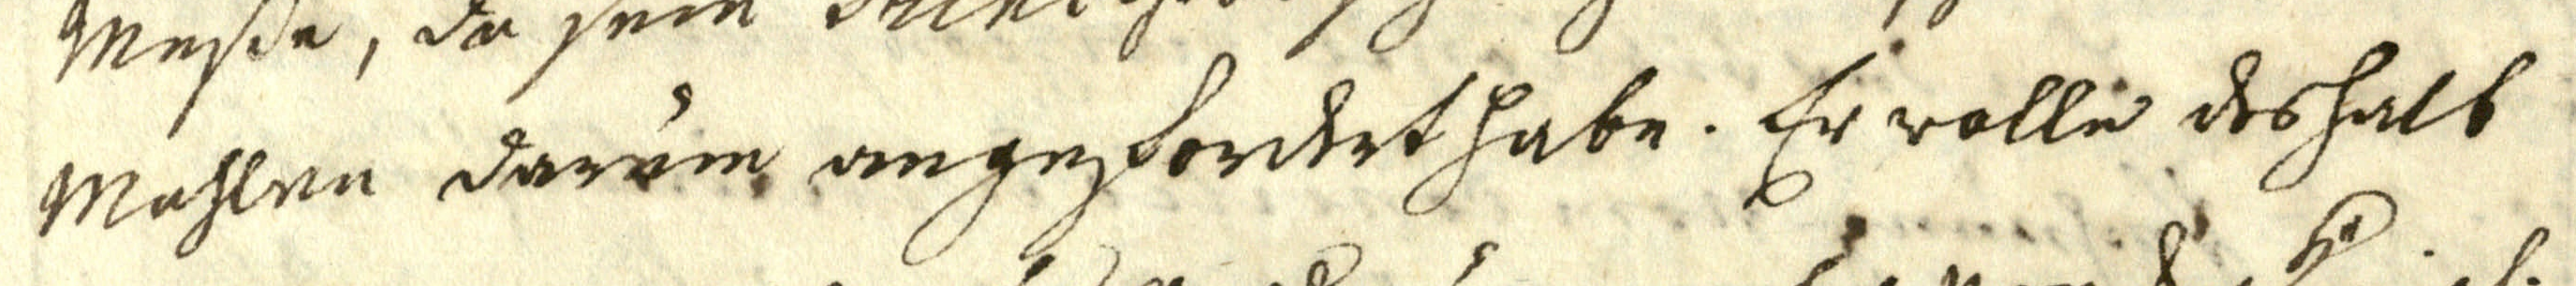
Mahlen darum angefordert habe. Er wolle deshalb
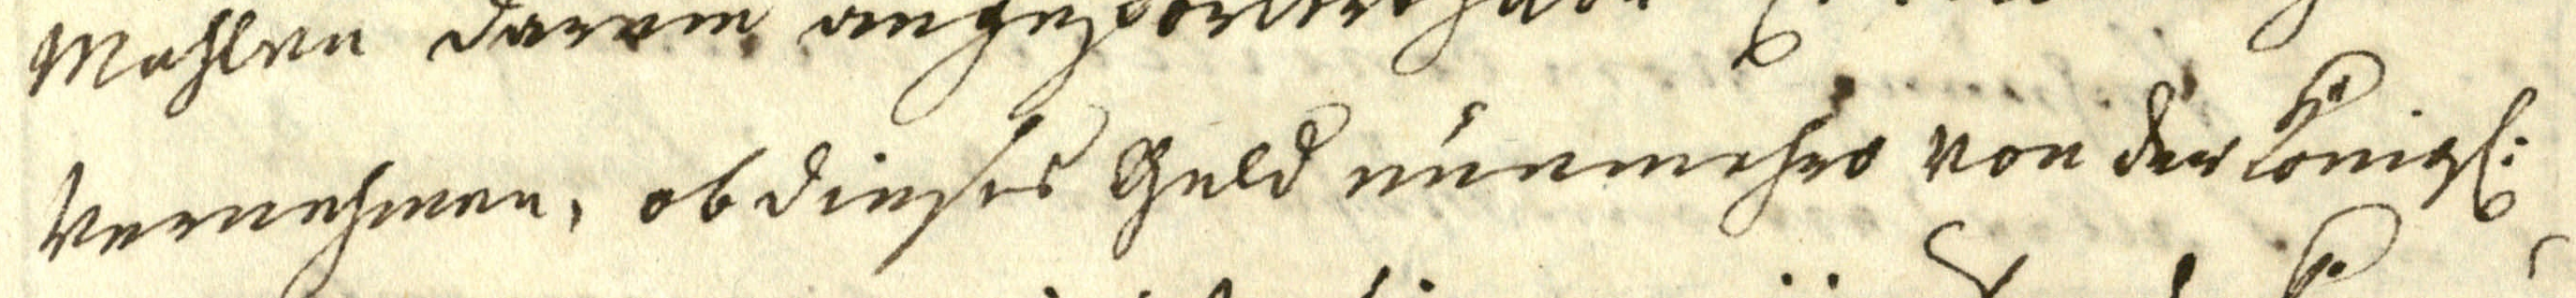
vernehmen, ob dieses Geld nunmehro von der Königl.
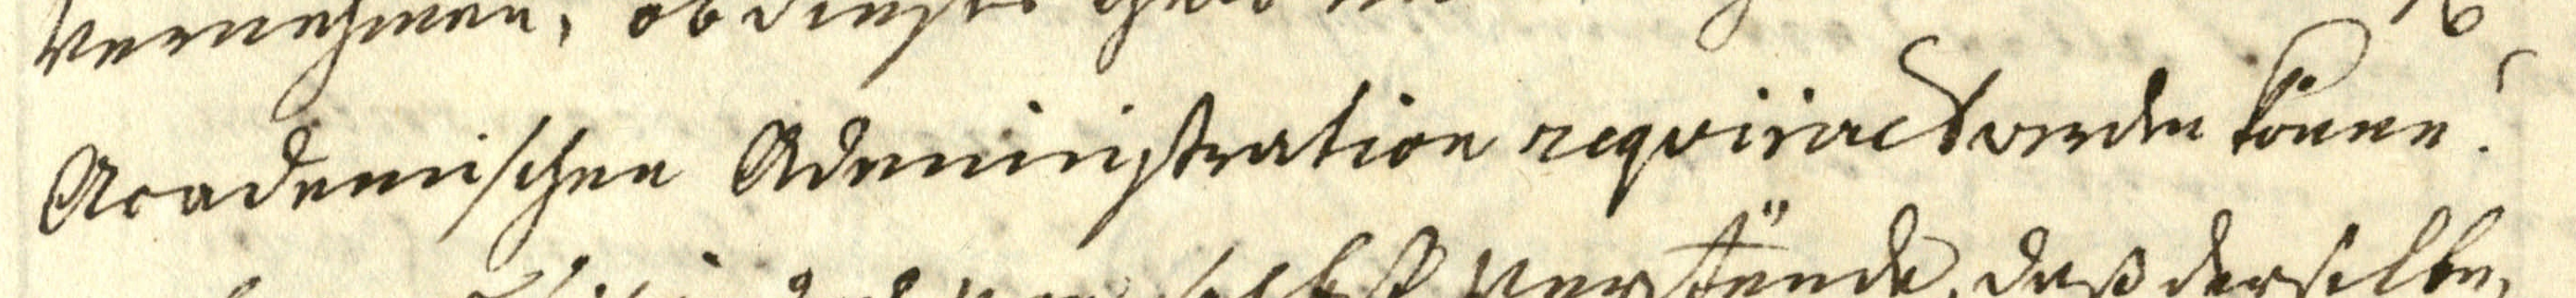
Academische Administration requiriret werden könne?
